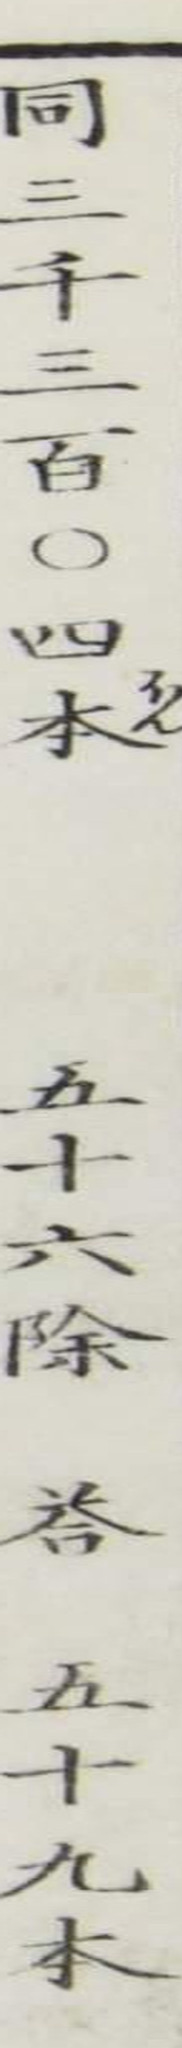同三千三百〇四本五十六除答五十九本
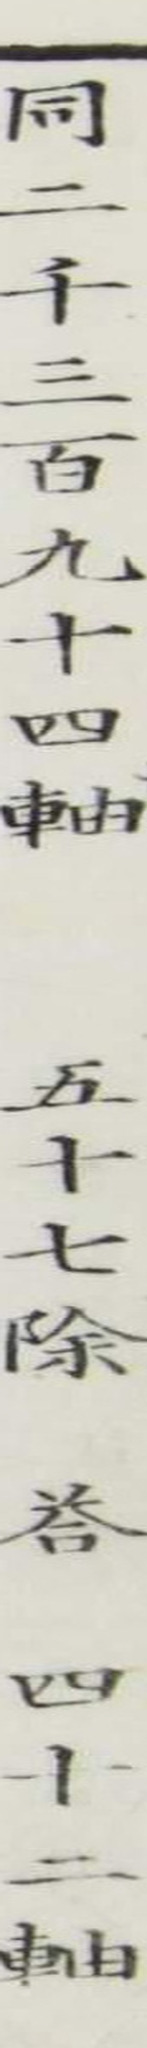同二千三百九十四軸五十七除答四十二軸
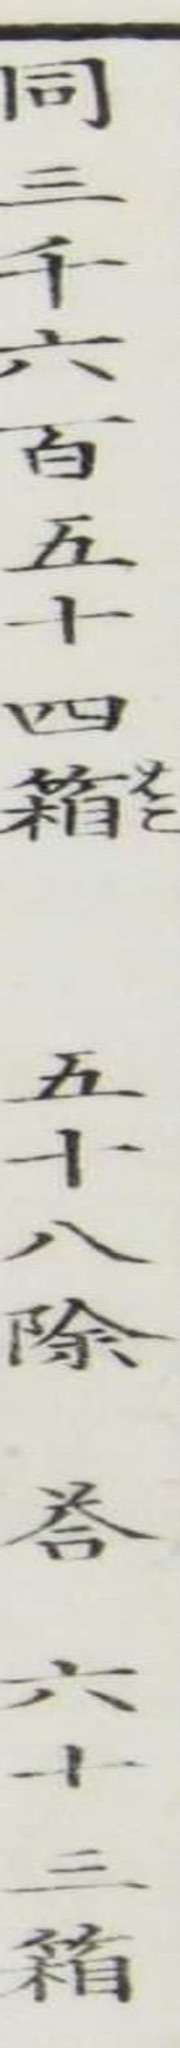同三千六百五十四箱五十八除答六十三箱
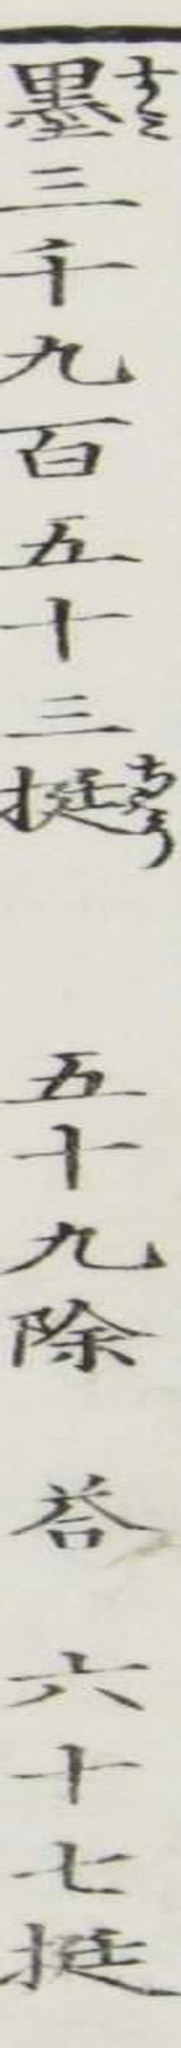墨三千九百五十三挺五十九除答六十七挺
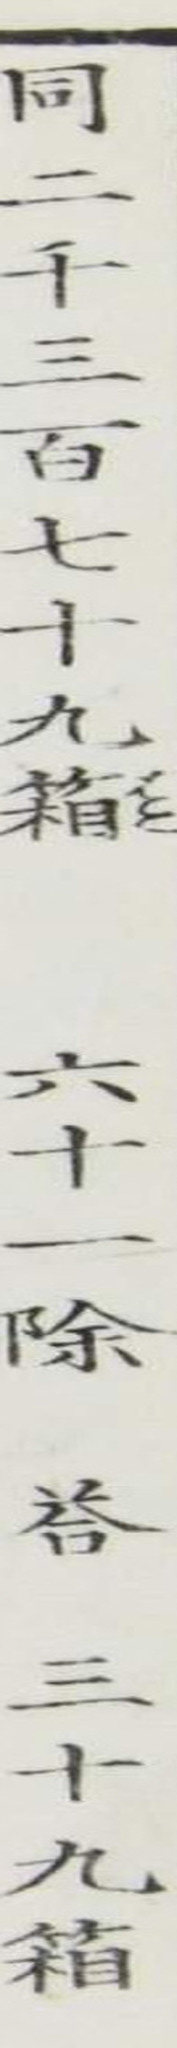同二千三百七十九箱六十一除答三十九箱
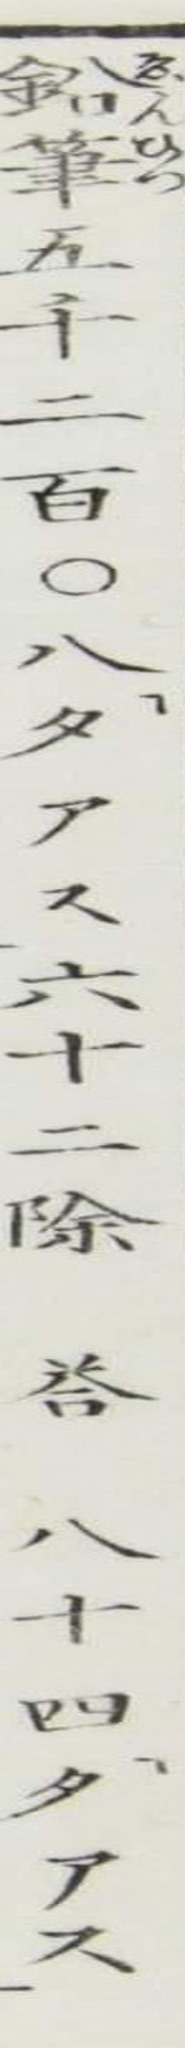鉛筆五千二百〇八「タアス」六十二除答八十四「タアス」
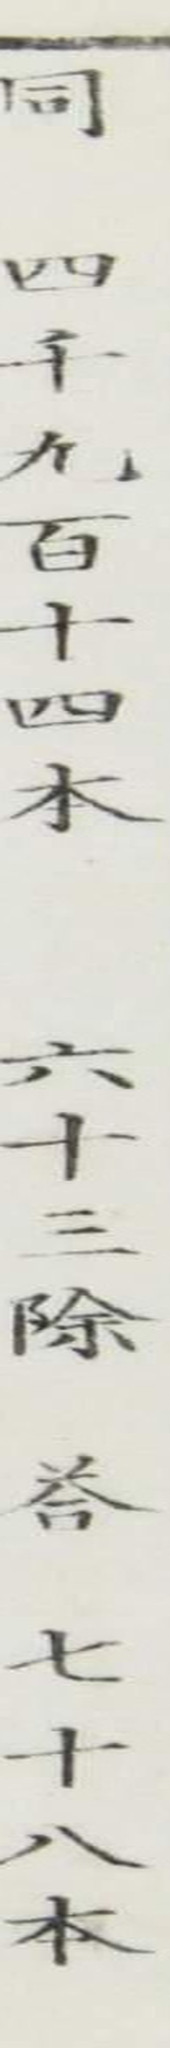同四千九百十四木六十三除答七十八木
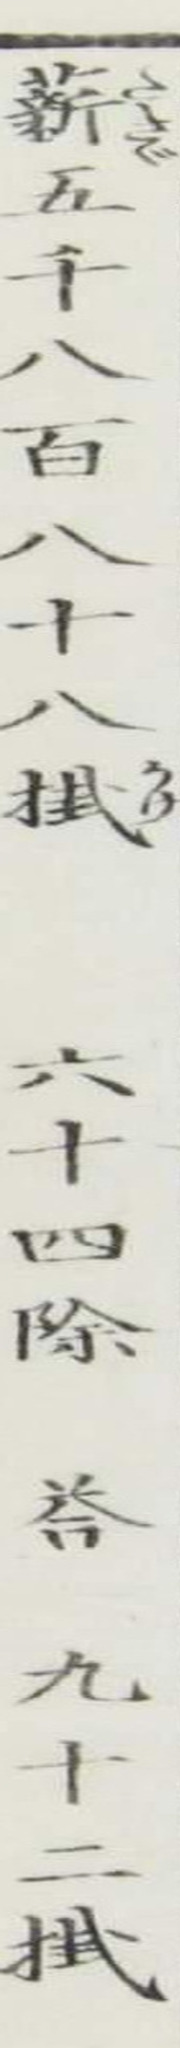薪五千八百八十八掛六十四除答九十二掛
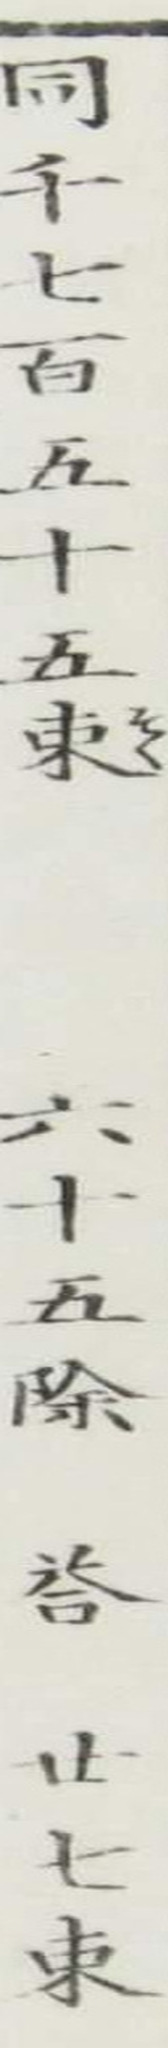同千七百五十五束六十五除答廿七束
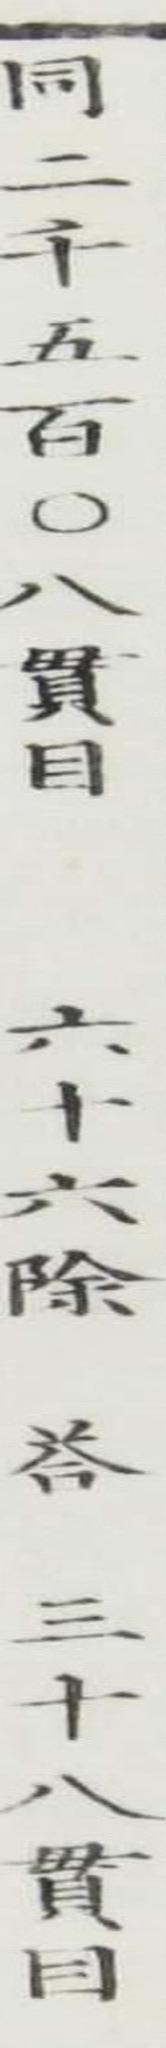同二千五百〇八貫目六十六除答三十八貫目
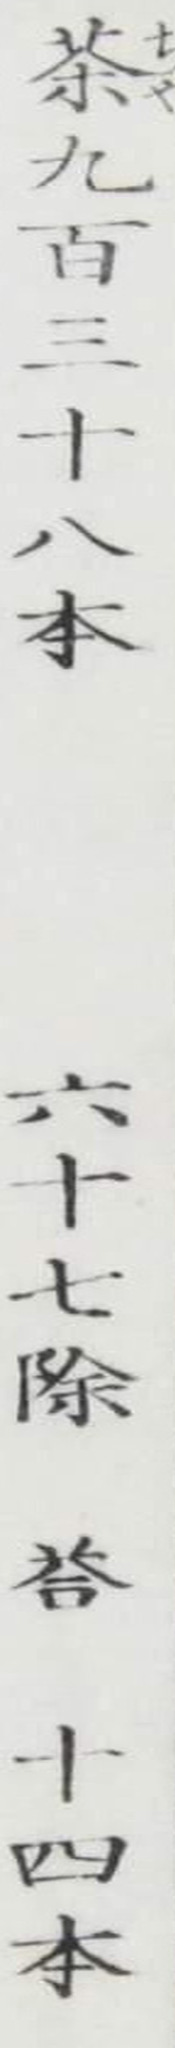茶九百三十八本六十七除答十四本
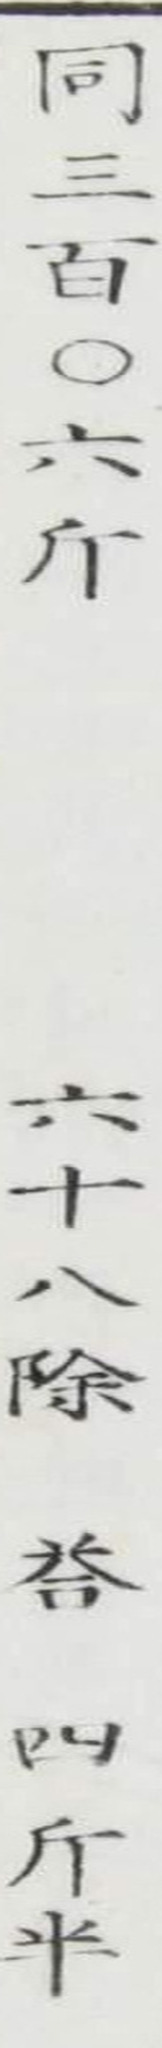同三百〇六斤六十八除答四斤半
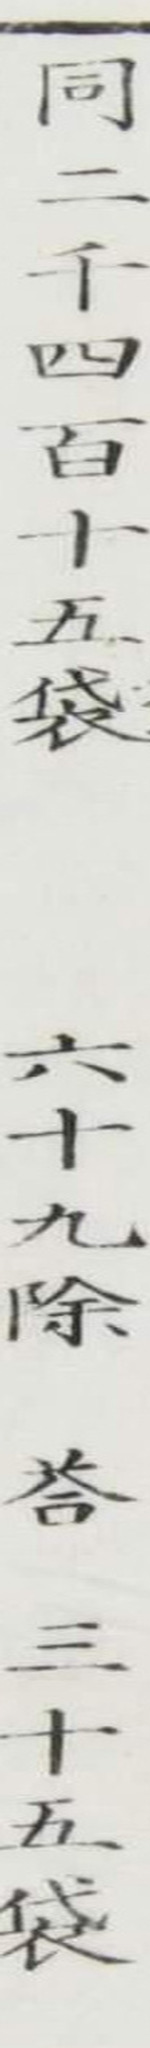同二千四百十五袋六十九除答三十五袋
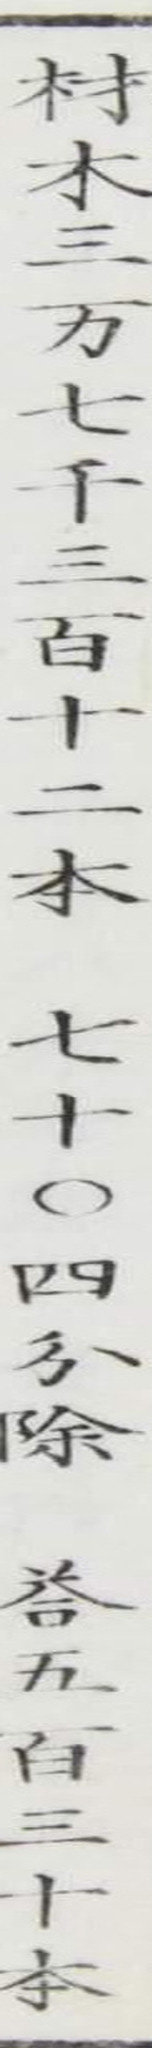材木三万七千三百十二本七十〇四分除答五百三十本
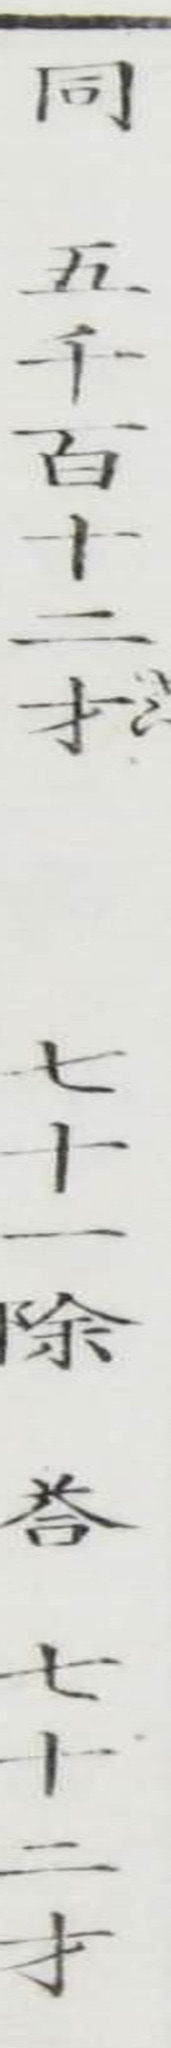同五千百十二才七十一除答七十二才
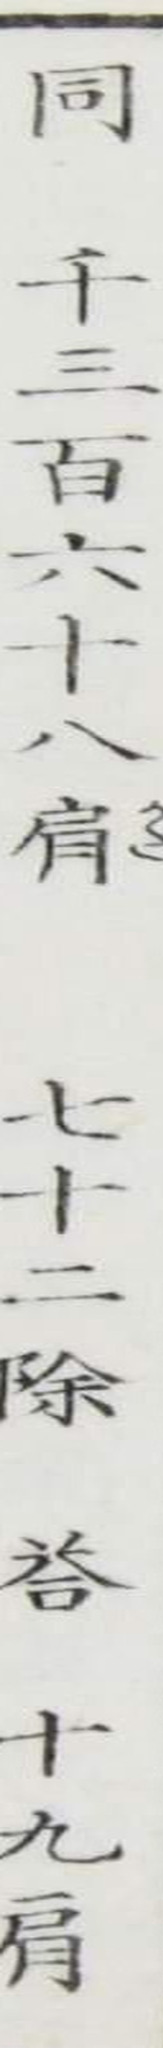同千三百六十八肩七十二除答十九肩
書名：明治小學塵劫記 卷1
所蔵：東京学芸大学教育コンテンツアーカイブ
